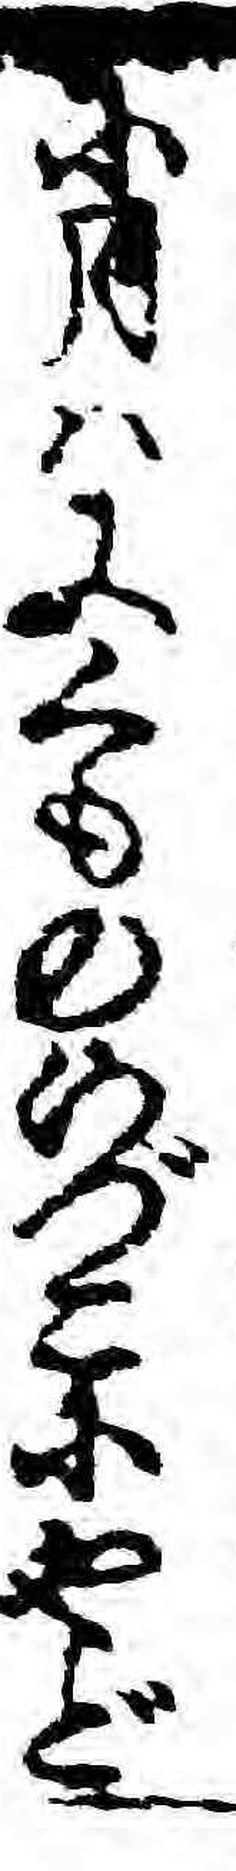に月は又くものいづこにやど
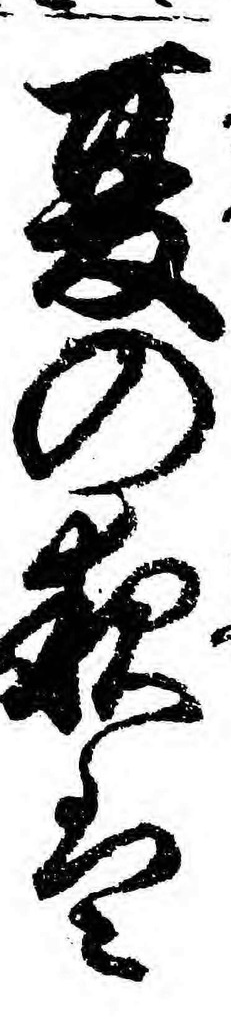夏の夜は
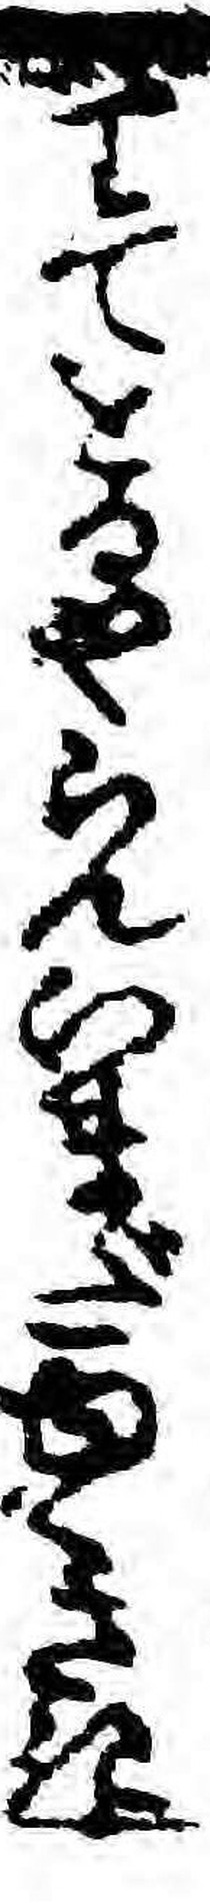りておるやらんいまだゆくさき
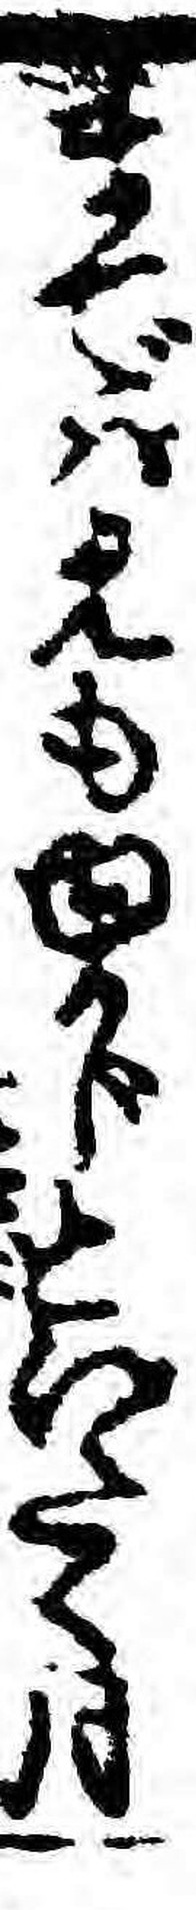まではえもゆかじといたく月
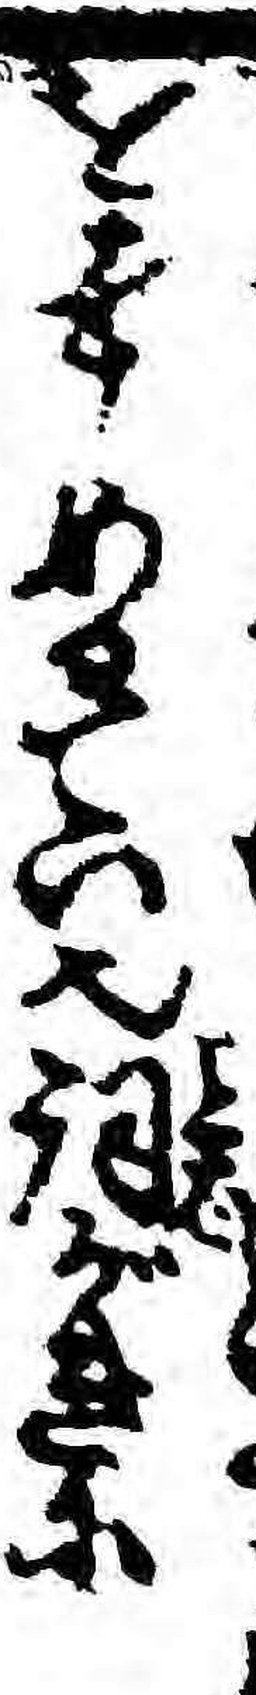ををしめるてい也詞がきに
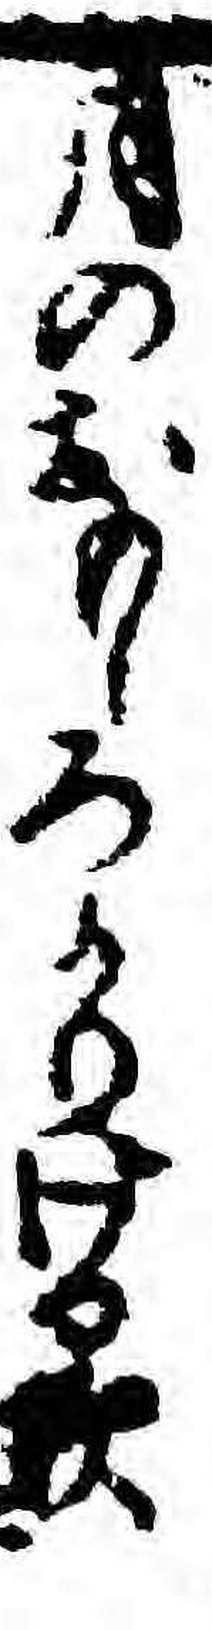月のおもしろかりける夜
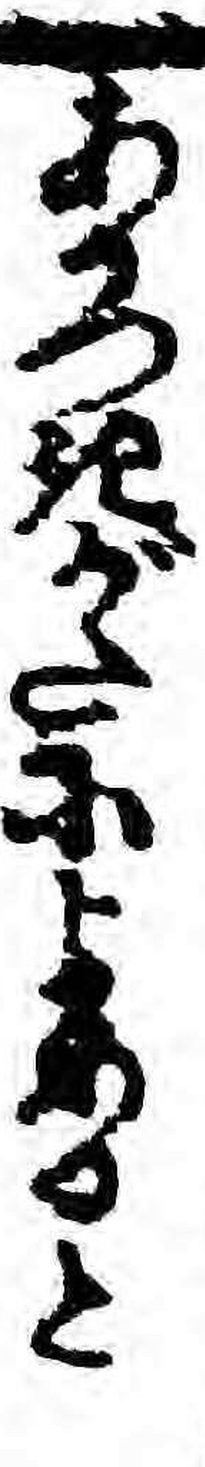あかつきがたによめると
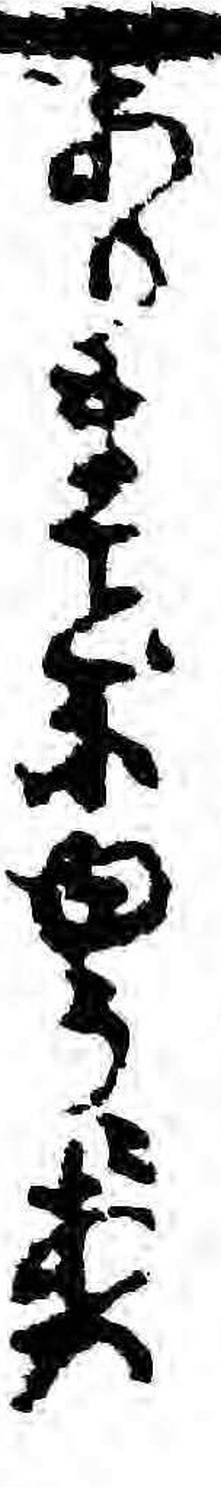ありまことにゆうにあは
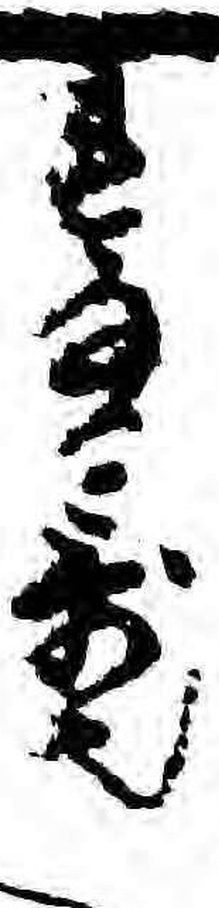れなる哥也
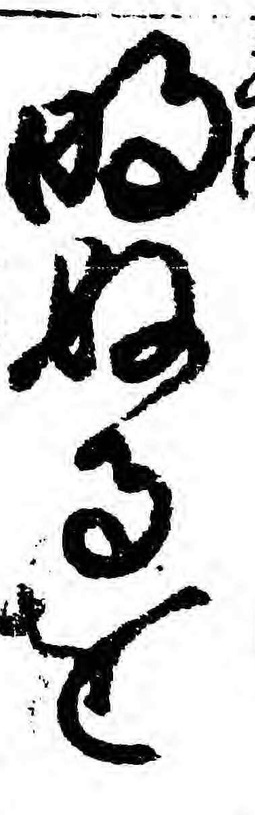明ぬるを
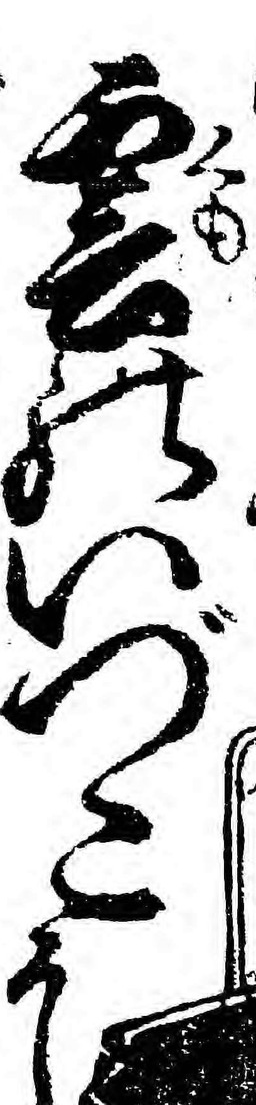雲のいづこに
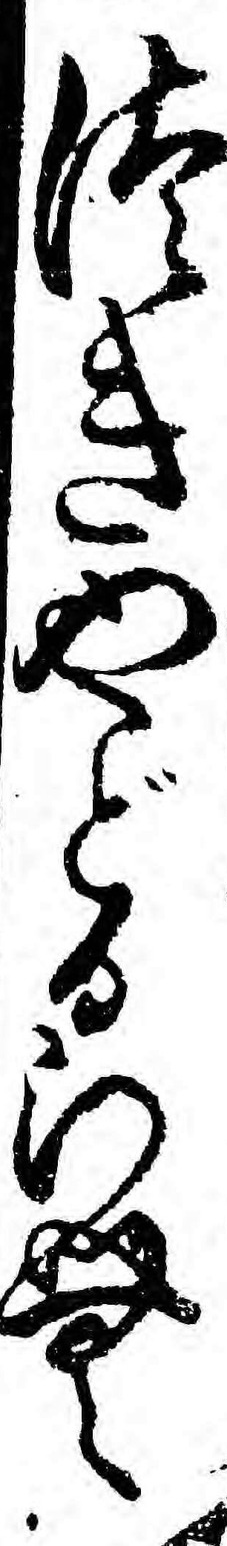つきやどるらむ
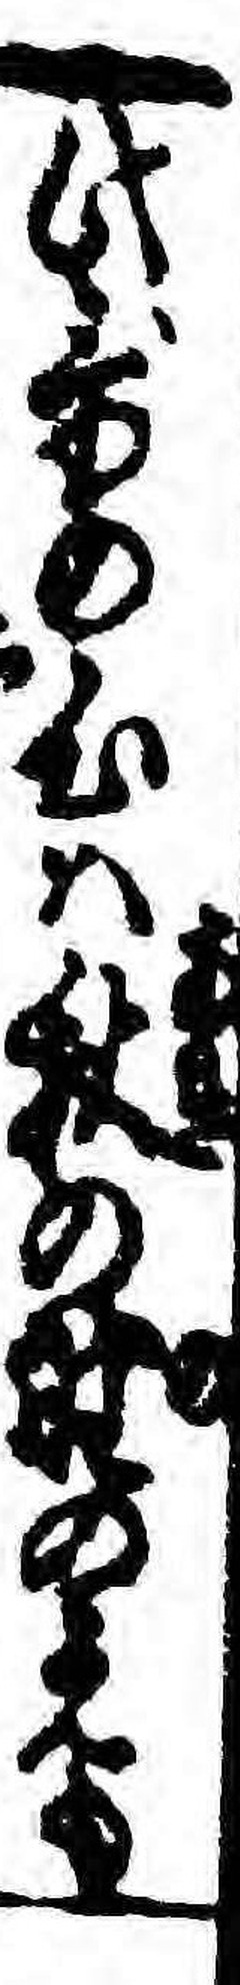此哥の心は秋の野のえも
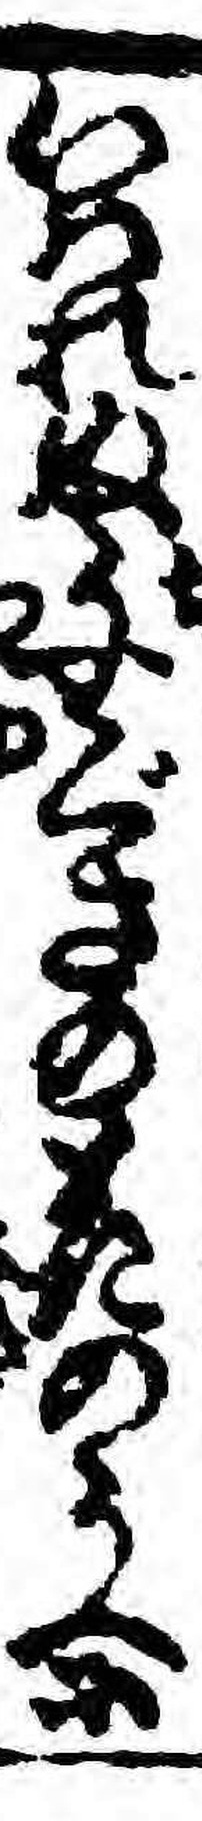いはれぬ千ぐさの花のうへに
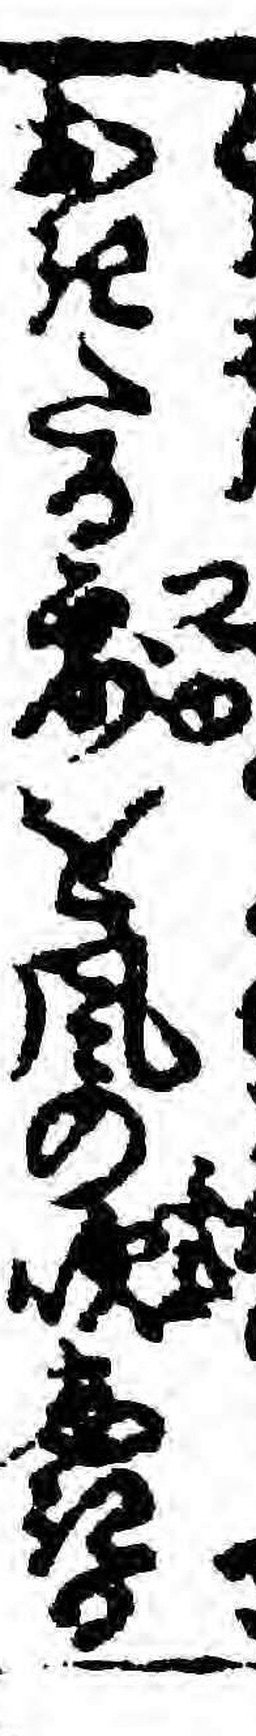おきたる露を風の吹しきり
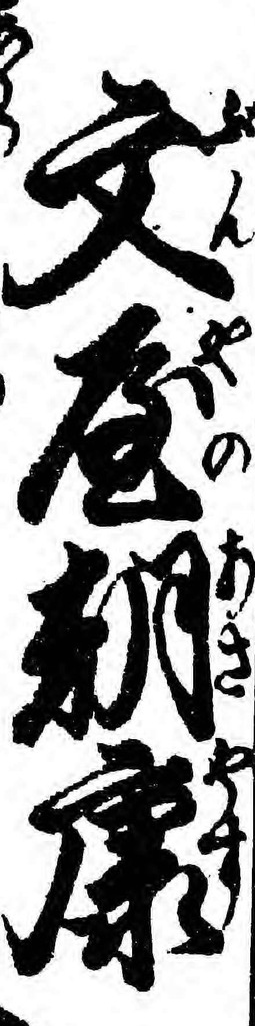文屋朝康
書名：頭書和歌注譯／壽賀多百人一首小倉錦
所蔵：国文学研究資料館
